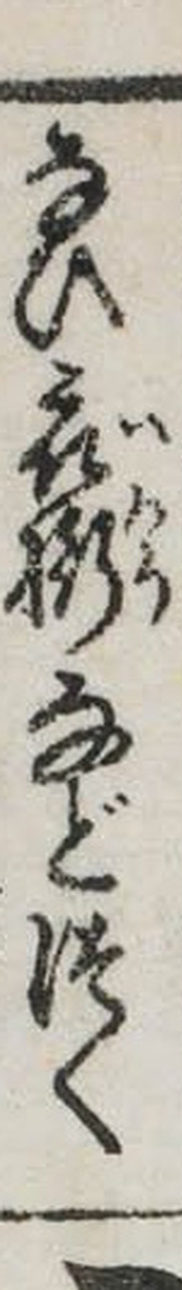なひ衣桁などつく
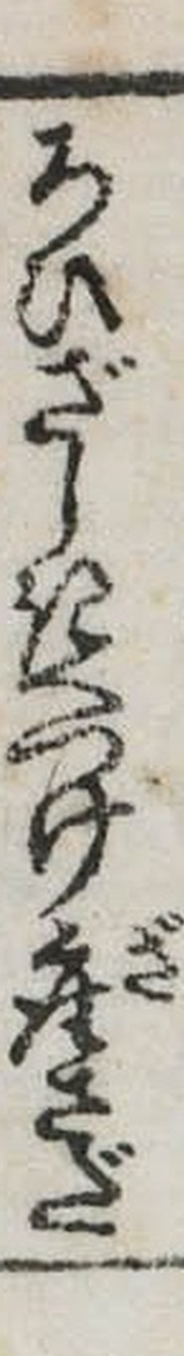ろひざしきへつけ座さだ
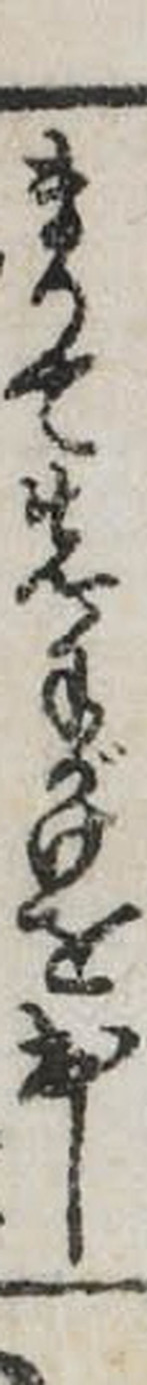まりて先手がけを出し
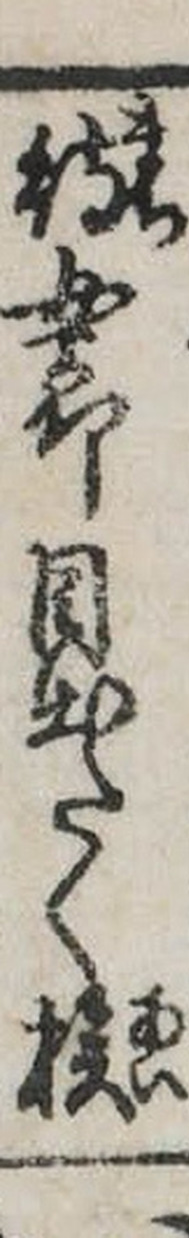待女郎目出たく挨
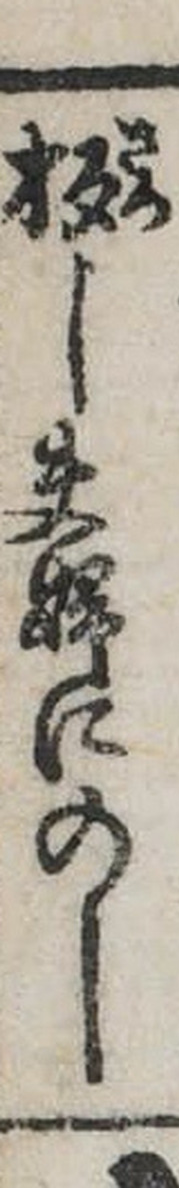拶し夫婦にのし

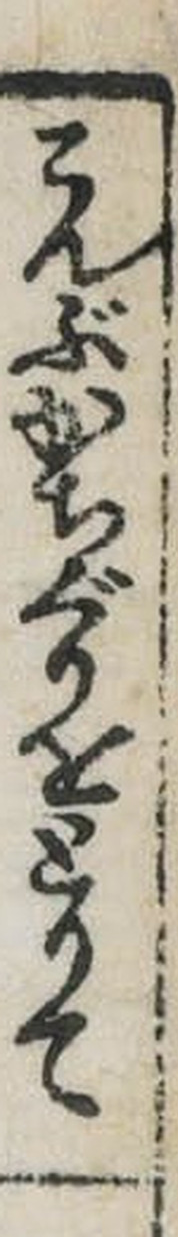こんぶかちぐりをとりて
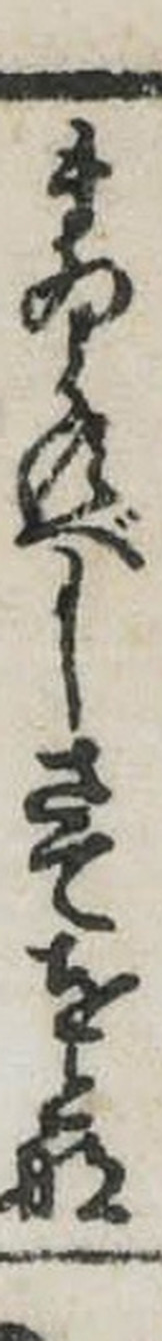まゐらすべしさてをとな
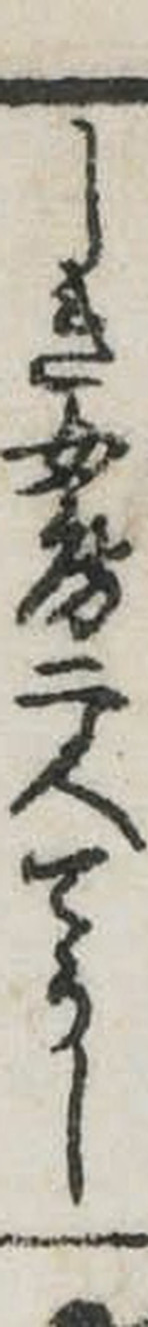しき女房二人てうし
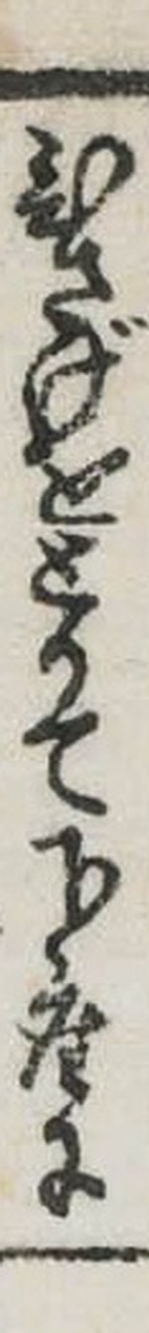ひさげをとりて下座に
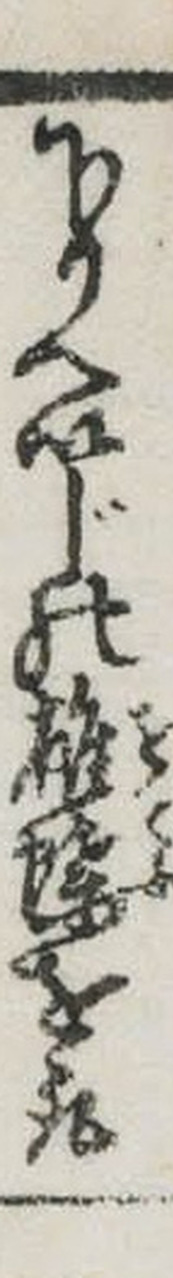下りへいじの雄蝶を取
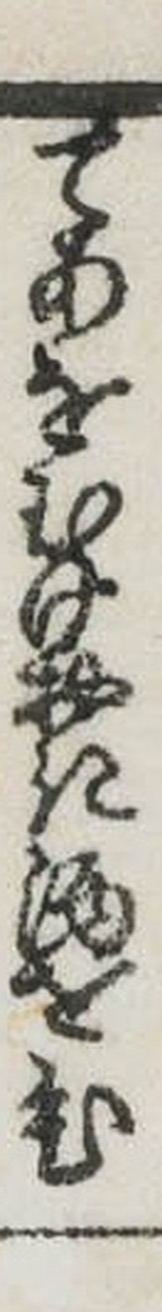てあをむけおき酒をひ
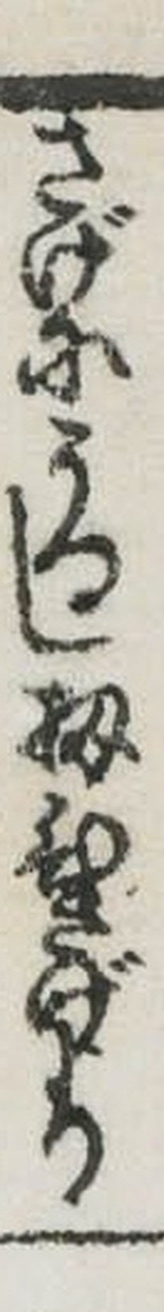さげにうつし扨ひさげより
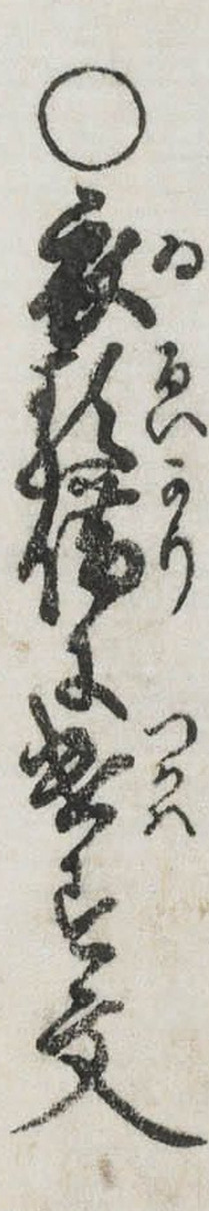○衣類借に遣す文
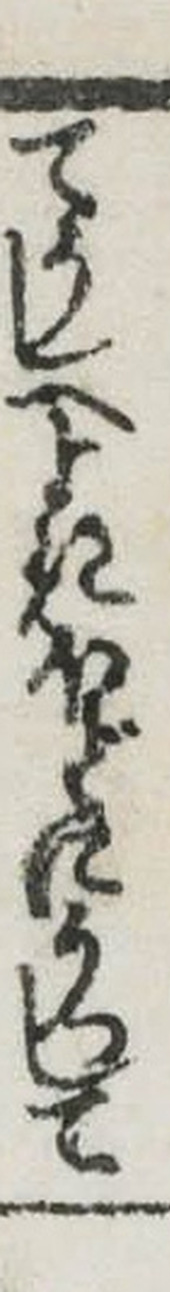てうしへよきほどにうつして
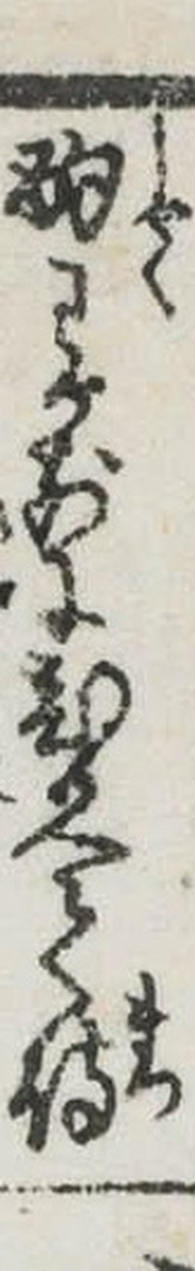酌わが前にひかへて待
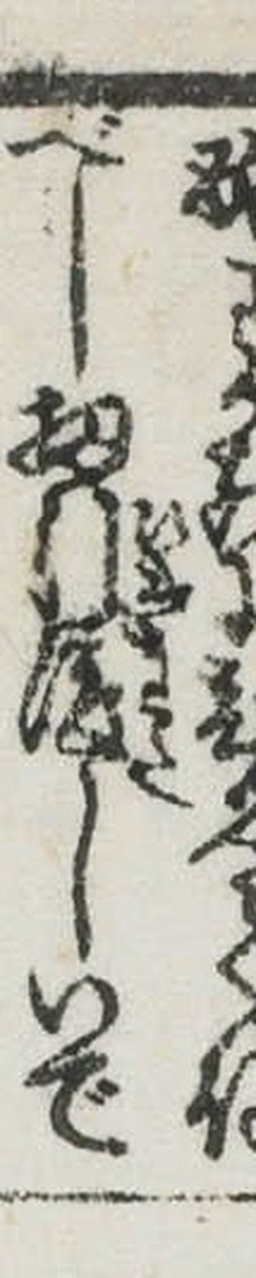べし扨引渡しいで
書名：頭書萬用婦人手紙之文言
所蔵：東京学芸大学教育コンテンツアーカイブ
